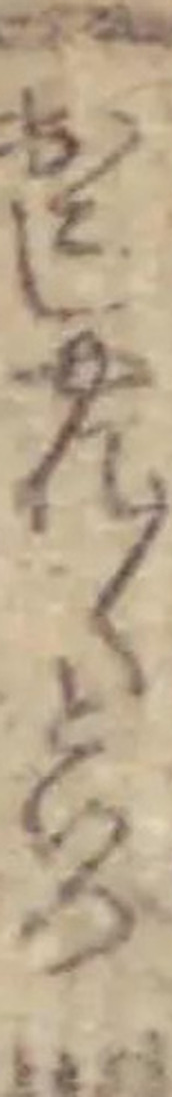おこしやれ〳〵といつ
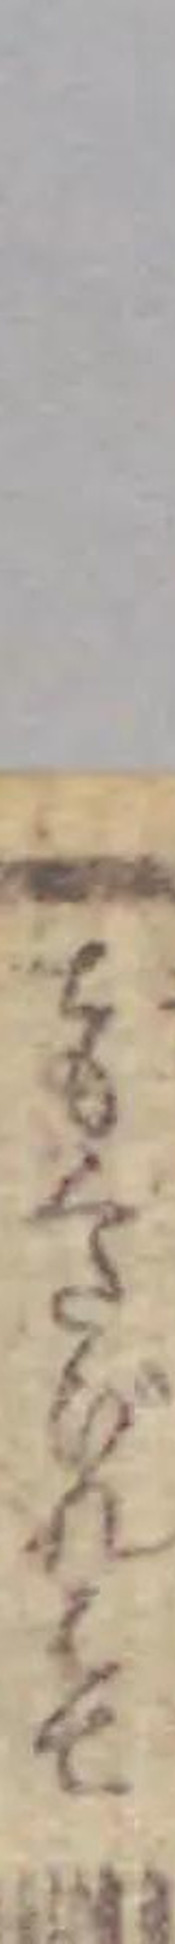てもくたびれはて
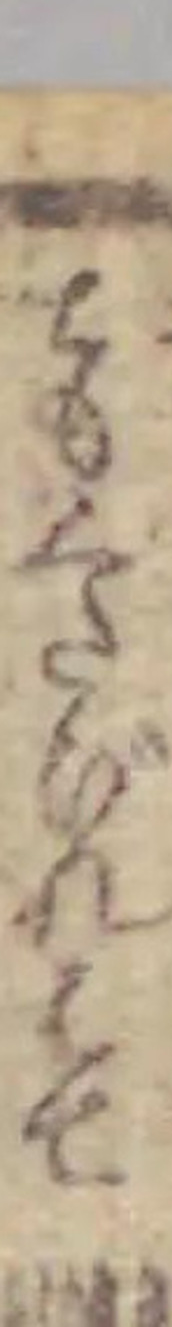てもくたびれはて
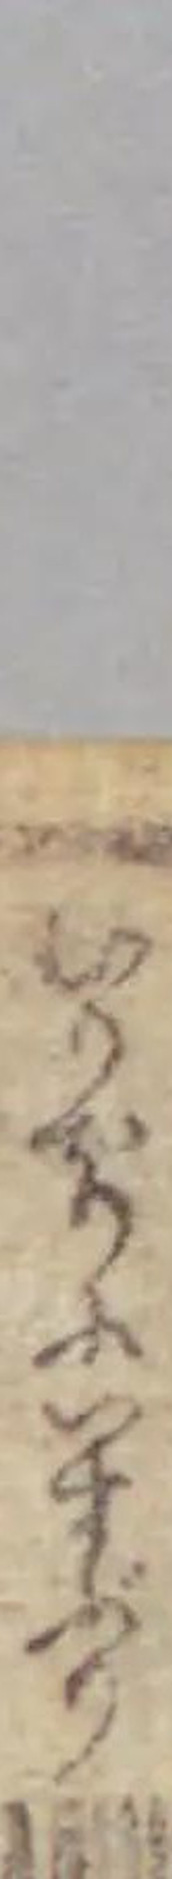むりやりにいすぶり
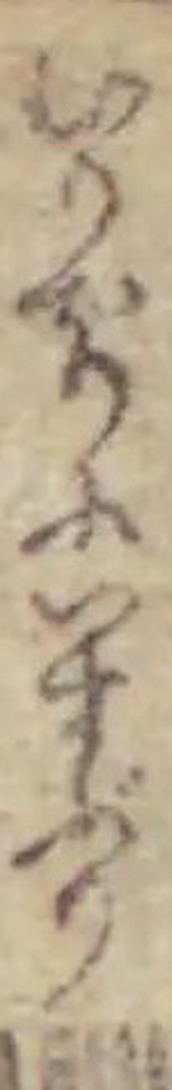むりやりにいすぶり
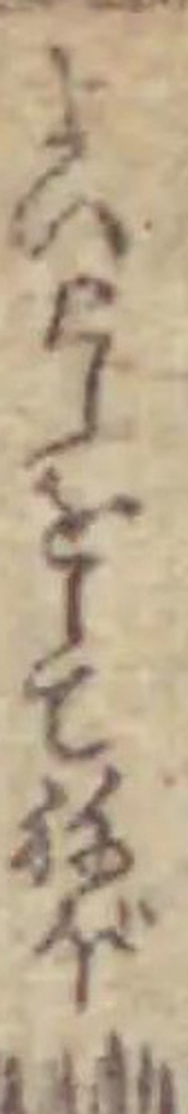よいとしをしてねぼ
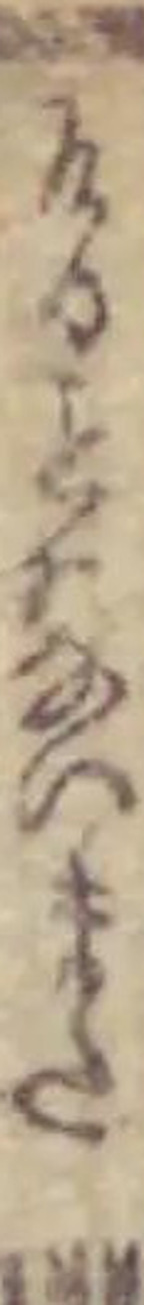けることは？ないまた
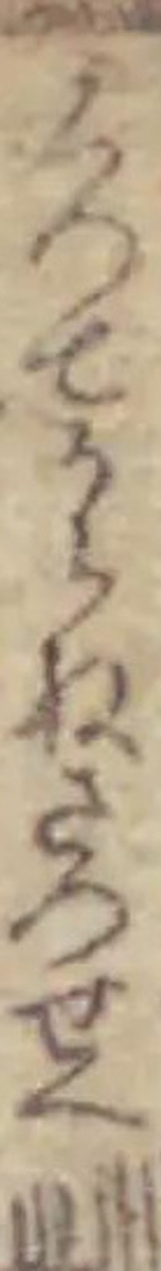くつてからねさつせへ
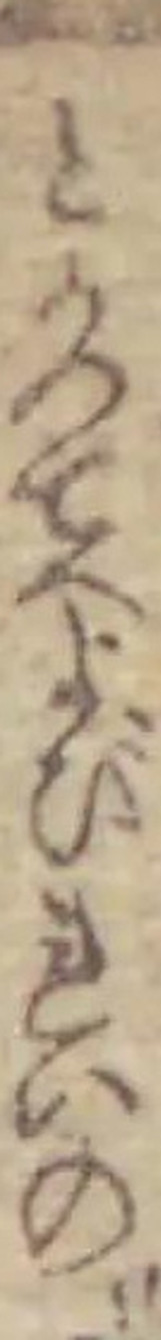とかつてへよびれいの
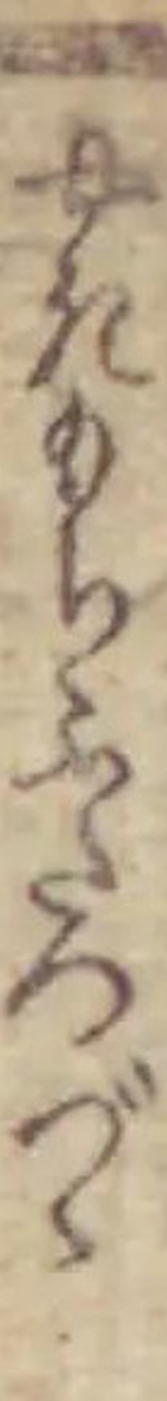やきもちふたつづゝ
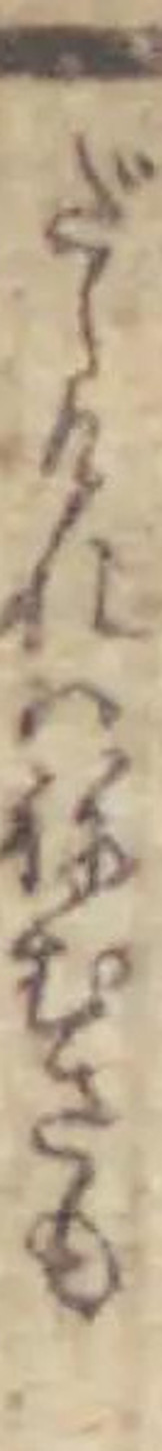だしけれはねむさも
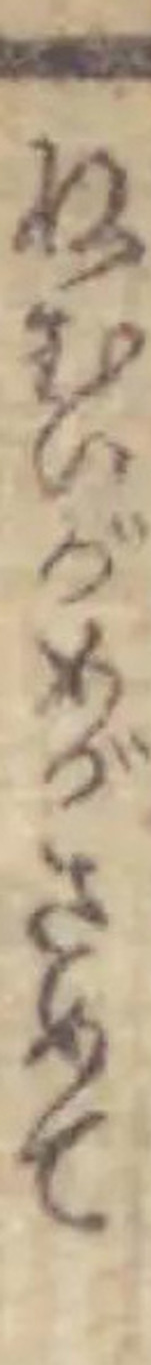ねむいがめがさめて
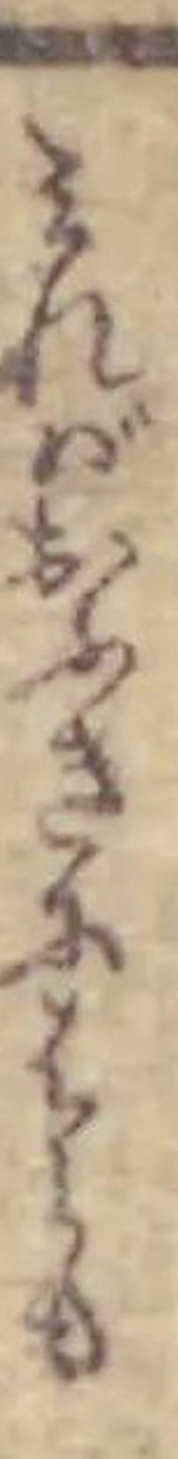みればおふきにはらも
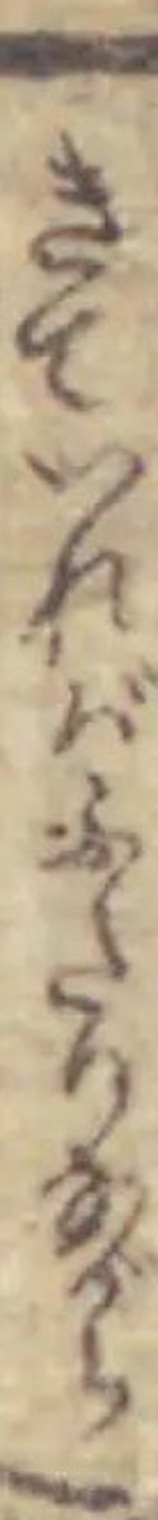きていればふたりながら
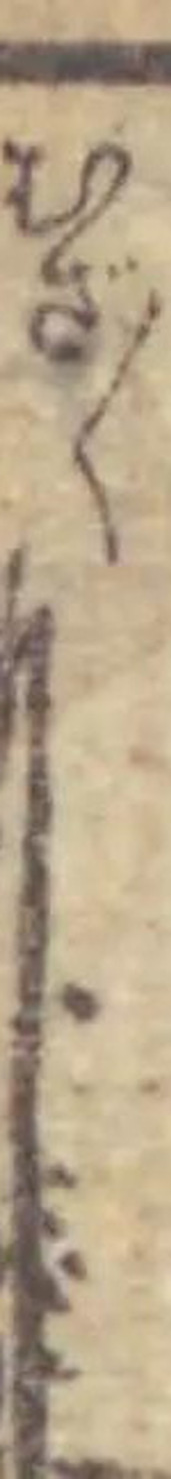むざ〳〵
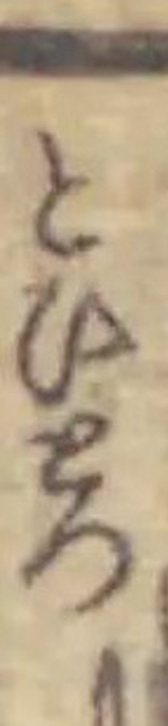とひとつ
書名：もふもふもふ怖噺 2巻
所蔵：国立国会図書館 National Diet Library, JAPAN
